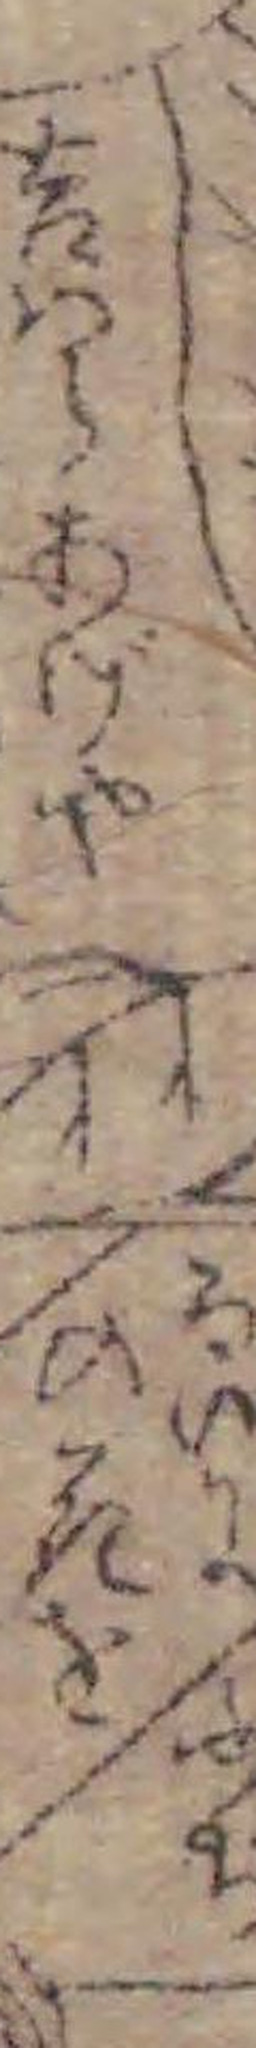吉はらのあげや
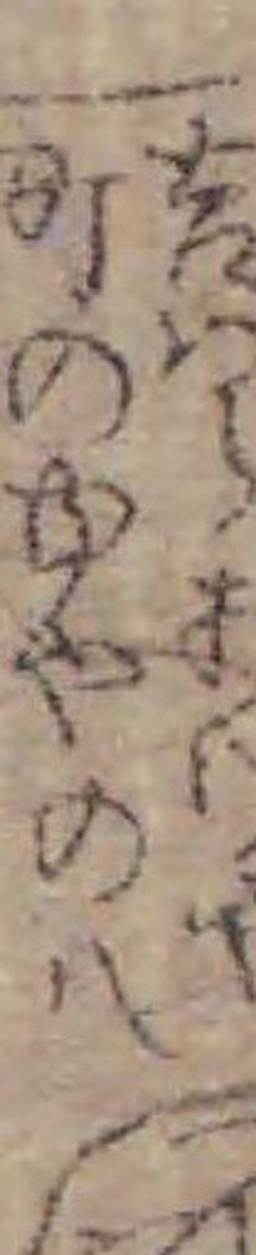町のゆやの八
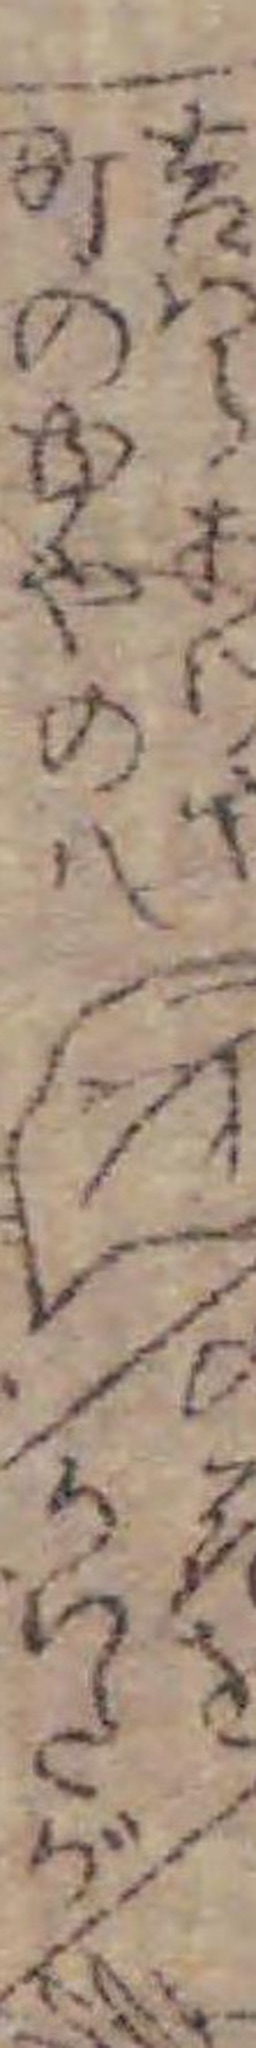町のゆやの八
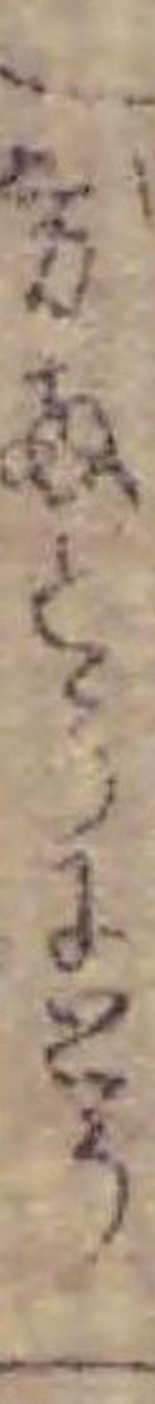方両とうにとう
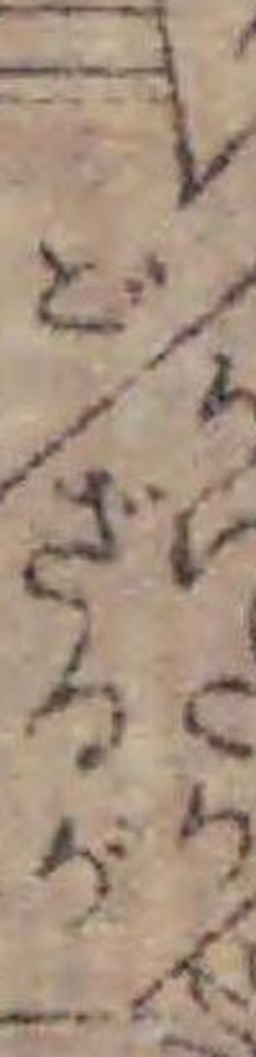ござるが
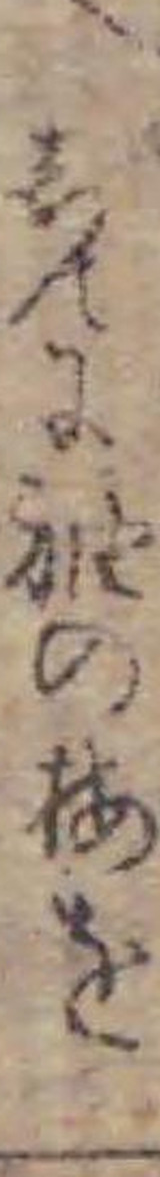しんに袖の梅を
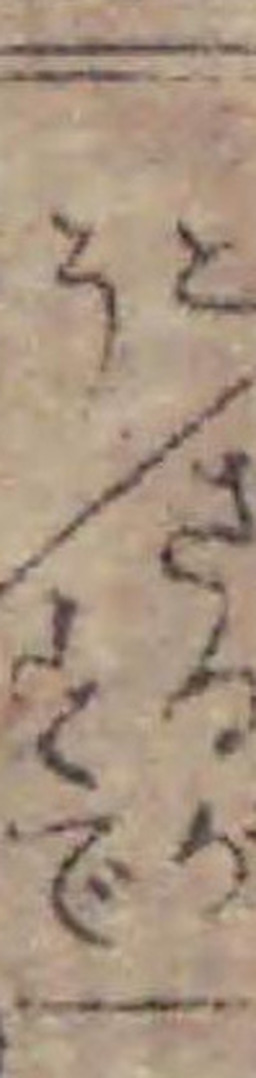うすで
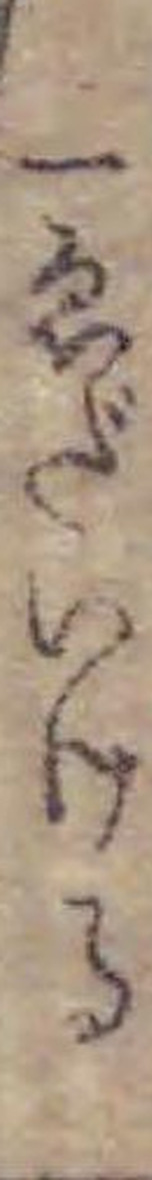一ゑだいける
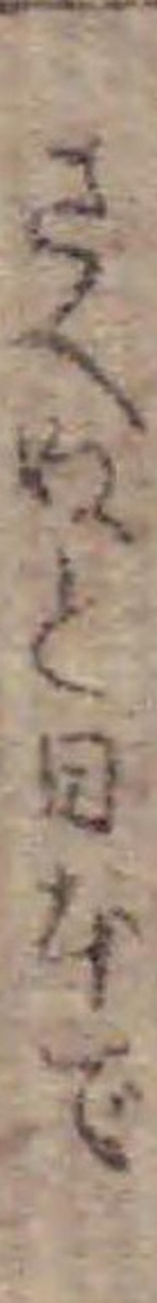さへぬと日本で
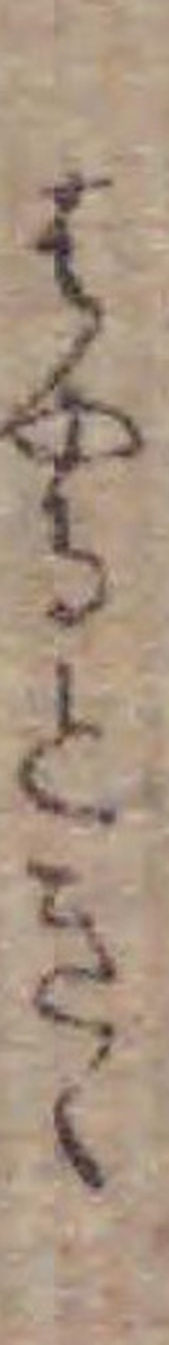はやるときゝ
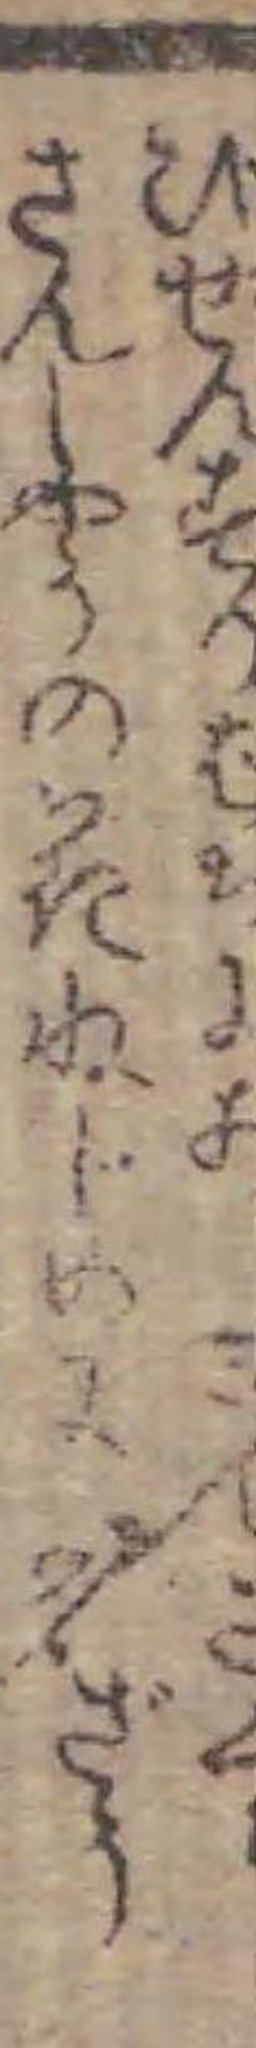さんしやうの花ねじめにざう
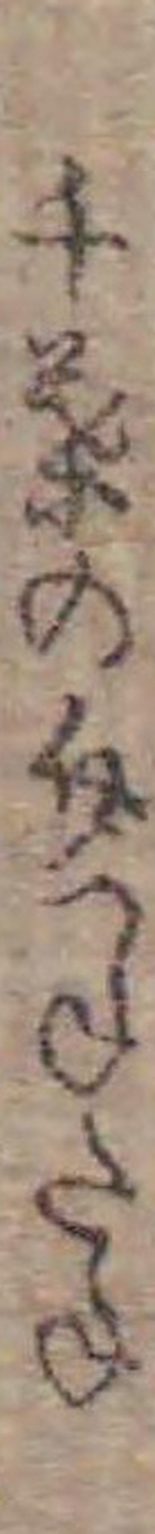千葉の介つねたね
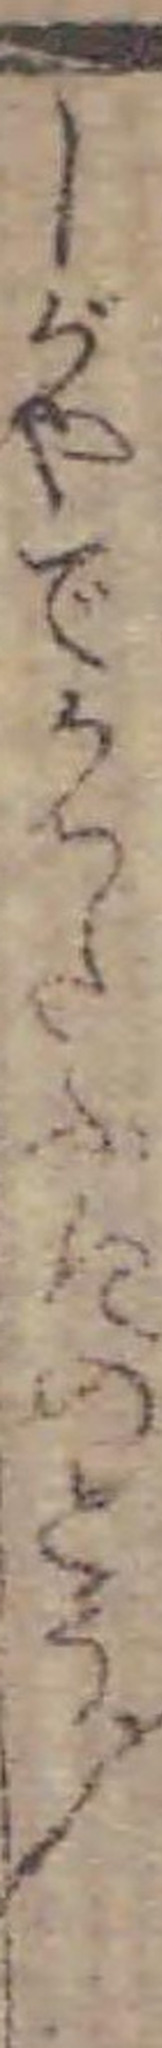しがやでかつたふきのとう
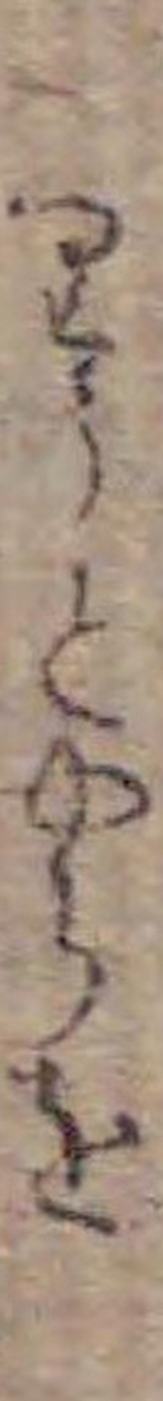りうとやらを
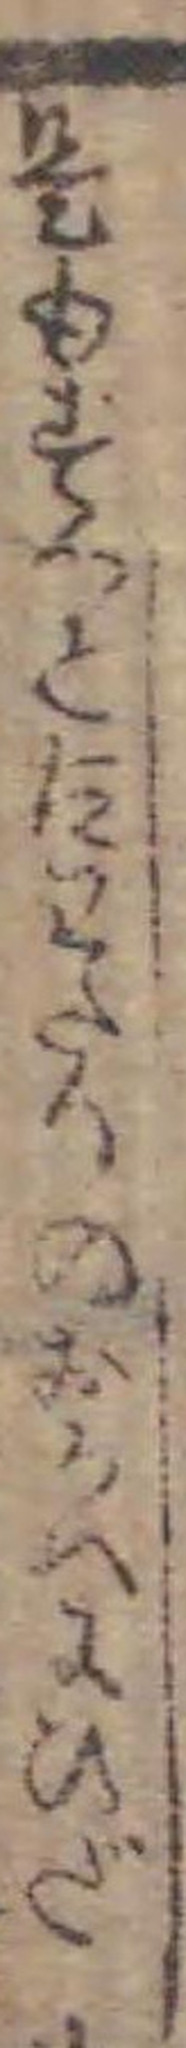是もずつと古わたりのおろ？はにひだ
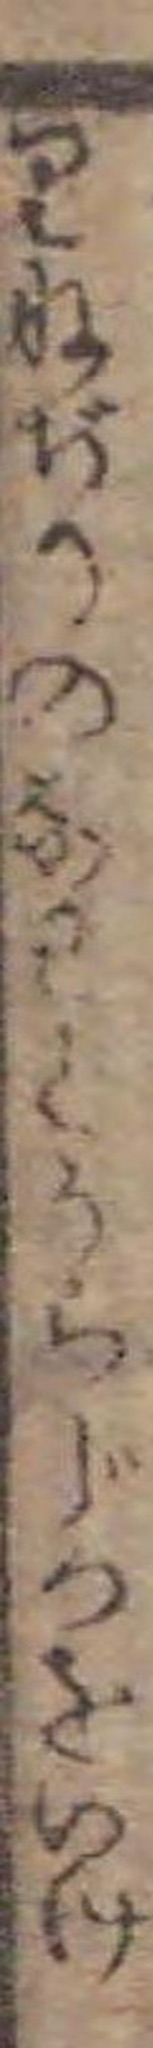りねぢりのなわとうらじろをいけ
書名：此奴和日本 : 2巻
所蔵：国立国会図書館 National Diet Library, JAPAN
